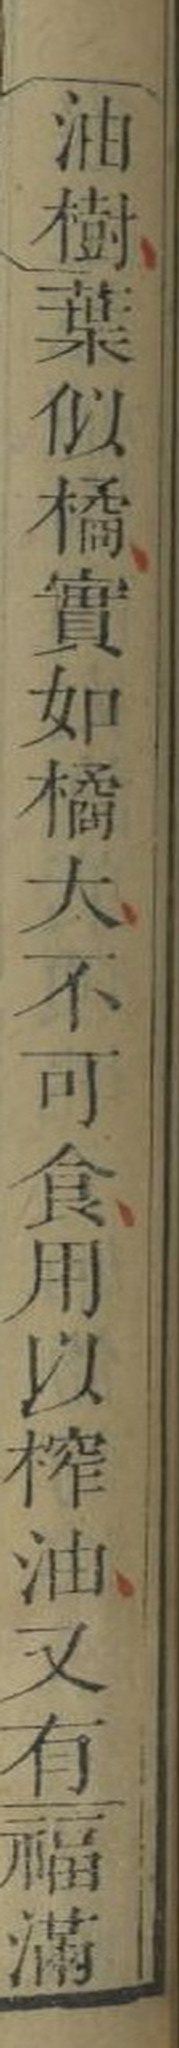[油樹]葉似橘実如橘大不可食用以榨油又有[福満
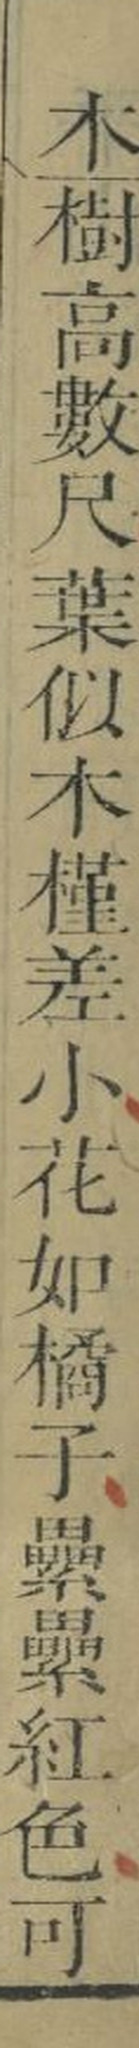木]樹高数尺葉似木槿差小花如橘子纍纍紅色可
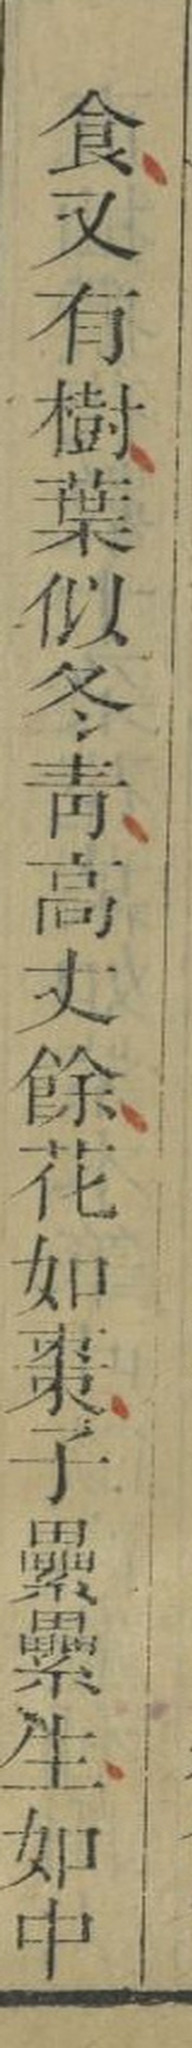食又有樹葉似冬青高丈余花如棗子纍纍生如中
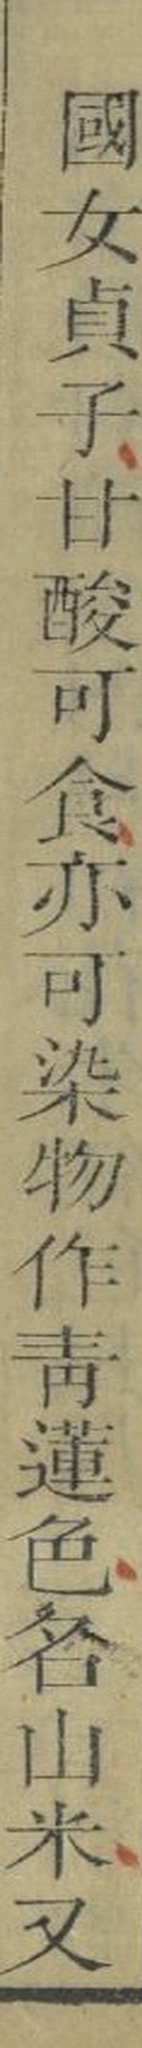国女貞子甘酸可食亦可染物作青蓮色名山米又
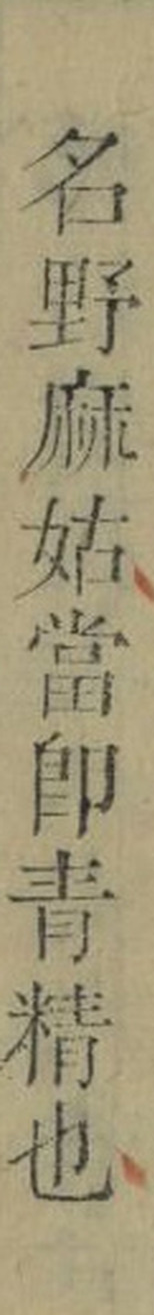名野麻姑当即青精也
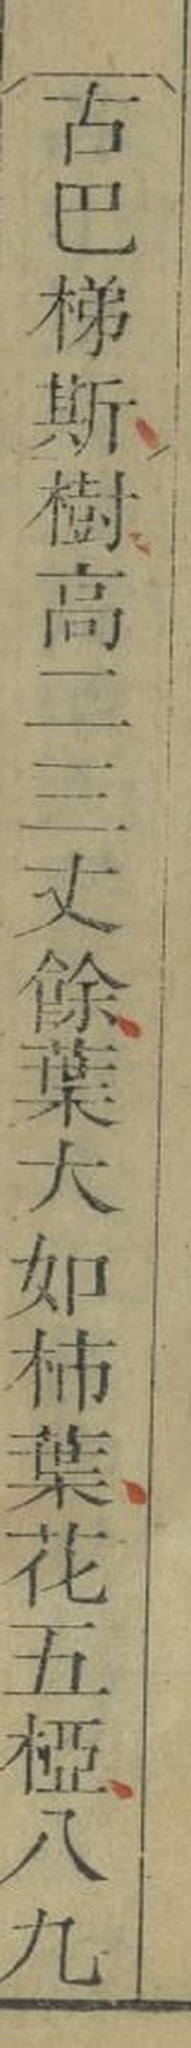[古巴梯斯]樹高二三丈余葉大如柿葉花五椏八九
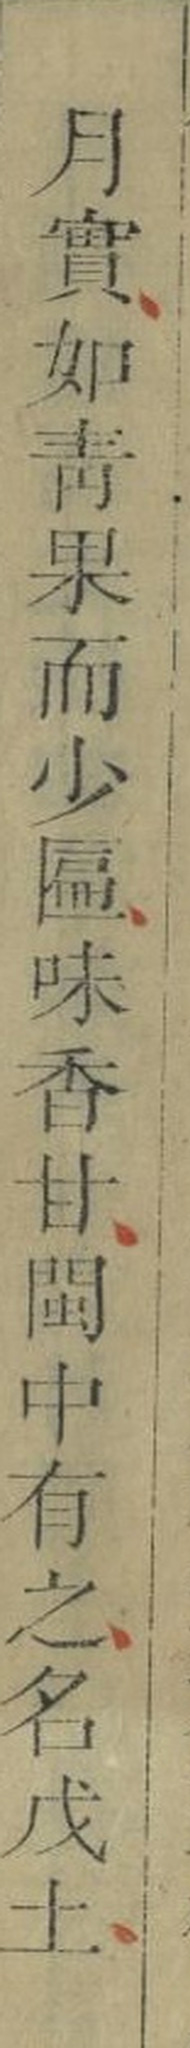月実如青果而少匾味香甘閩中有之名戊土
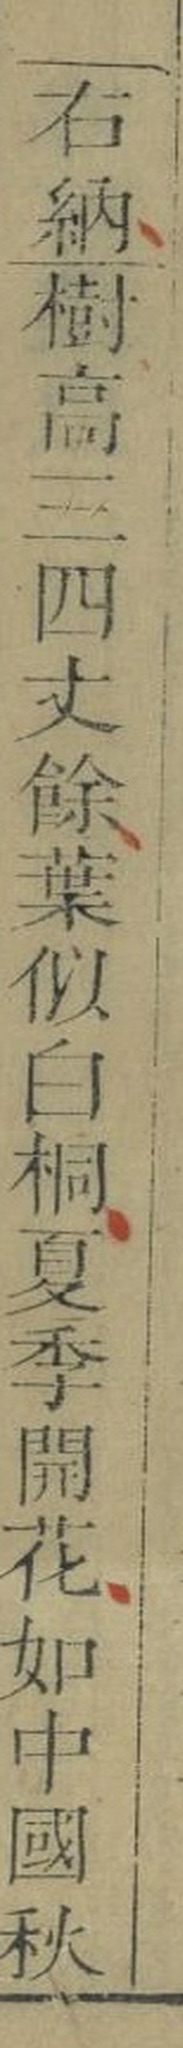[右納]樹高三四丈余葉似白桐夏季開花如中国秋
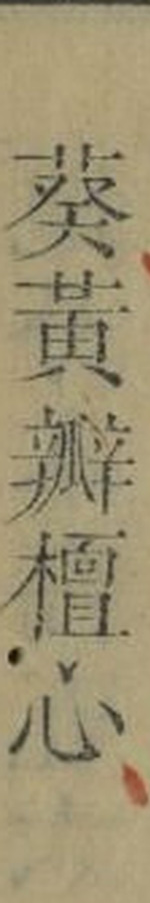葵黄弁檀心

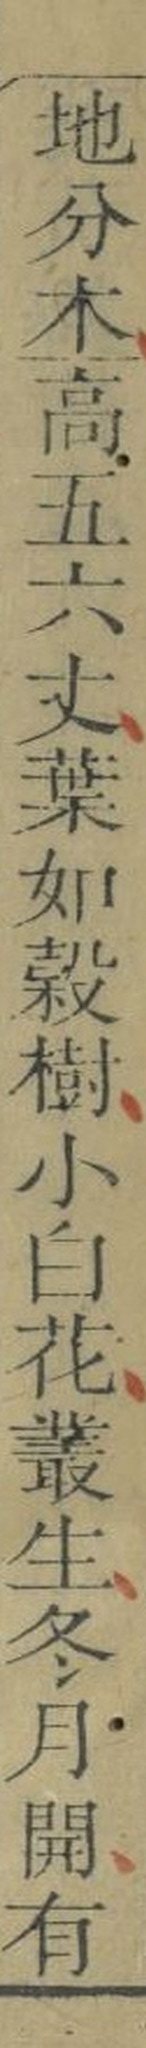[地分木]高五六丈葉如穀樹小白花叢生冬月開有
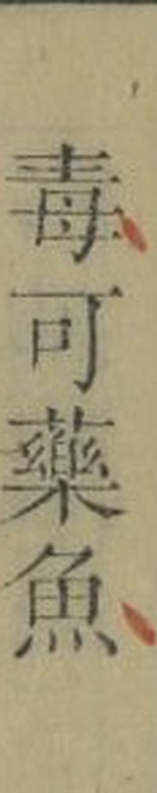毒可薬魚
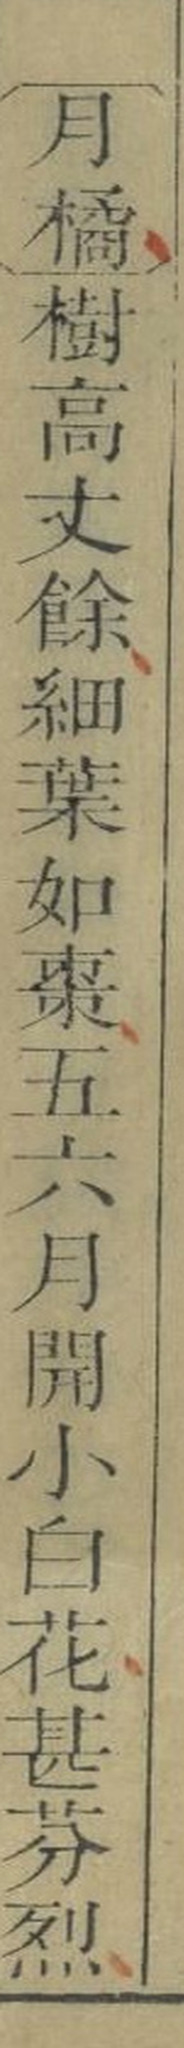[月橘]樹高丈余細葉如棗五六月開小白花甚芬烈
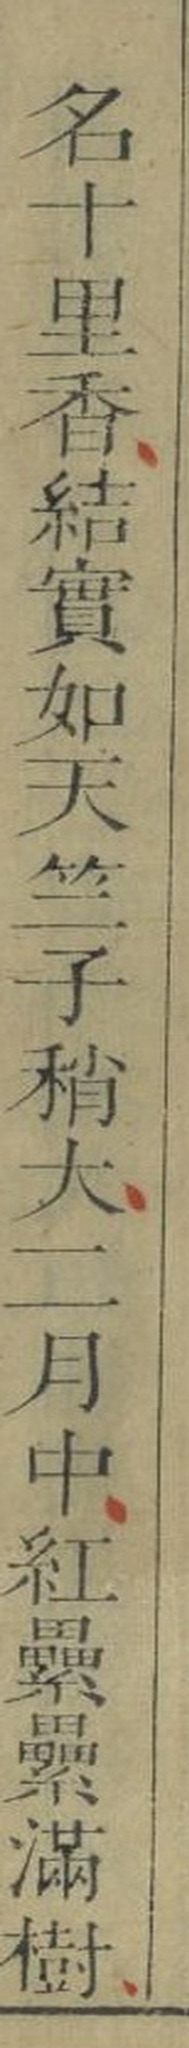名十里香結実如天竺子稍大二月中紅纍纍満樹
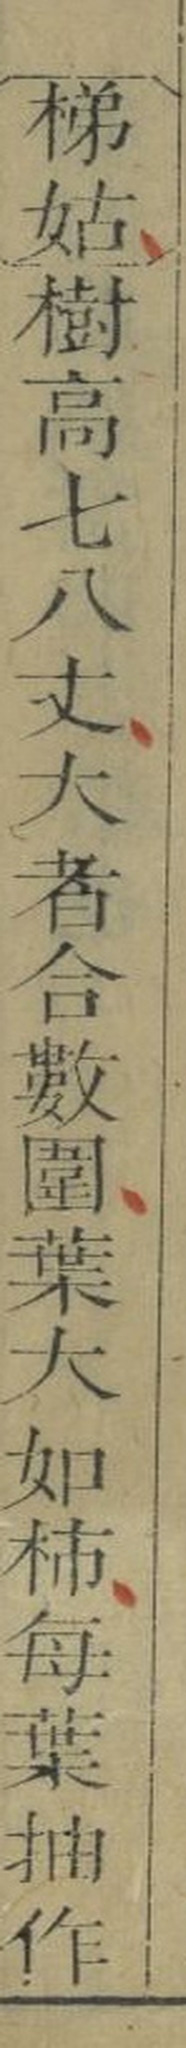[梯姑]樹高七八丈大者合数囲葉大如柿毎葉抽作
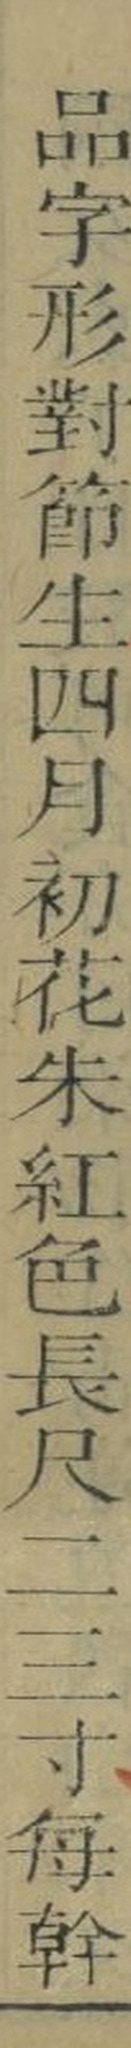品字形対節生四月初花朱紅色長尺二三寸毎幹
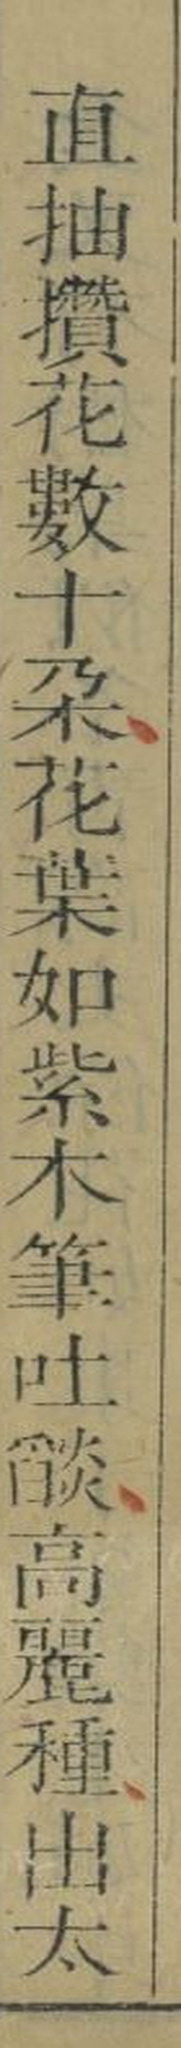直抽攢花数十朶花葉如柴木筆吐燄高麗種出太
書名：中山伝信録 巻六
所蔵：University of the Ryukyus Library
